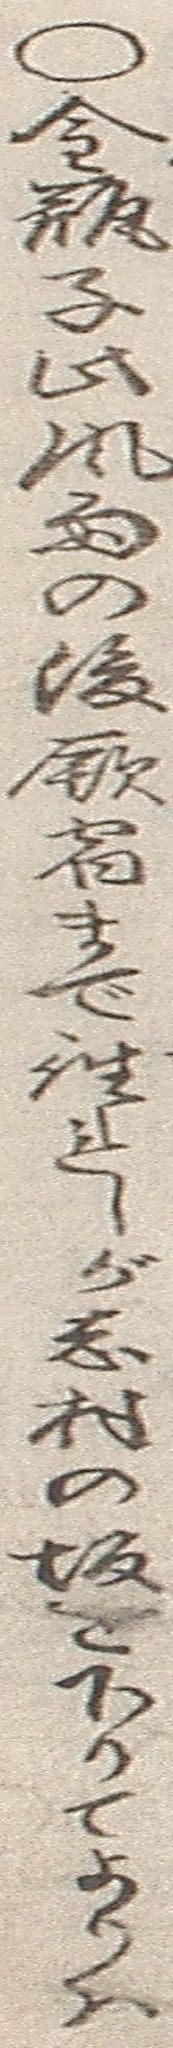◯金瓶子此風雨の後蕨宿まで往れしが志村の坂を下りてよりハ
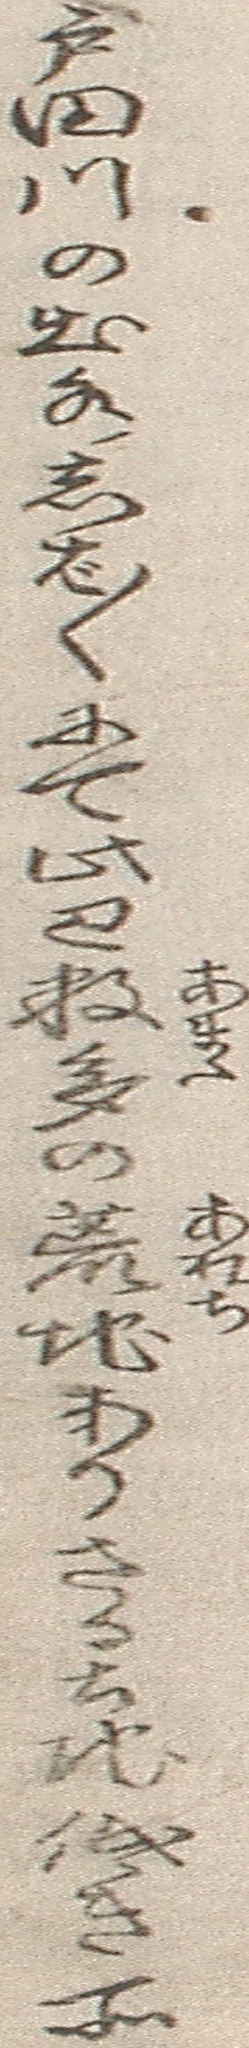戸田川の出水しば〳〵にて此辺数多の荒地ありたる土地低き所

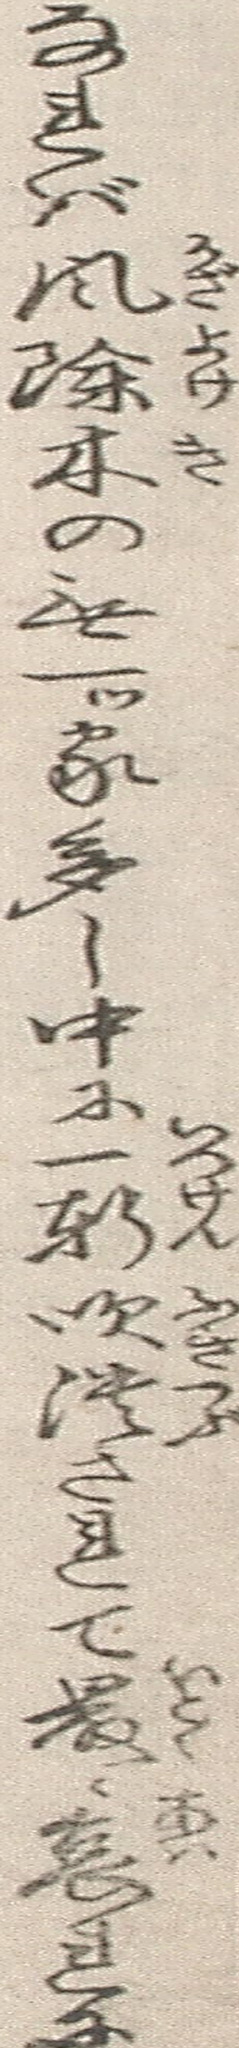なれバ風除木の無一ッ家多し中に一軒吹潰されて最々哀れに
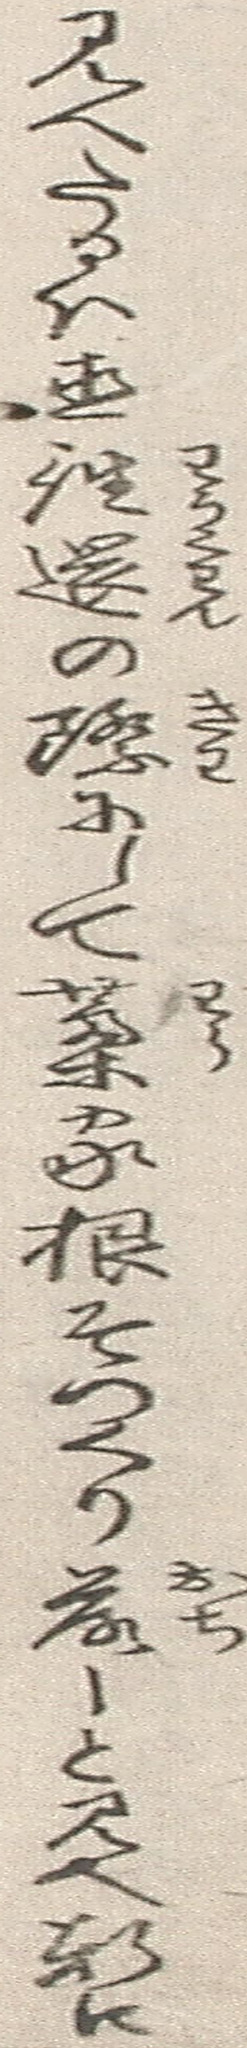見へたるハ直往還の際にして藁家根そつくり落しと見へ軒口
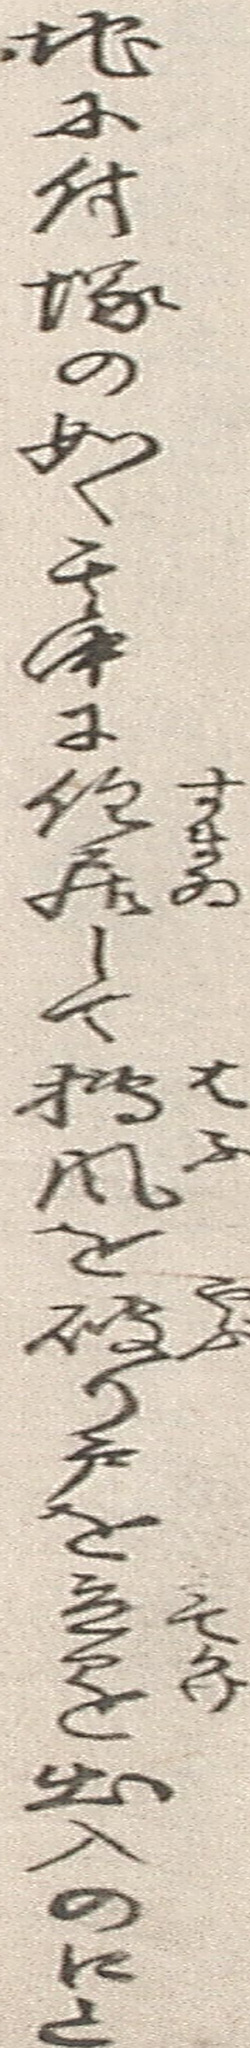地に付塚の如く其中に住居して破風を破り戸を立懸出入の口と
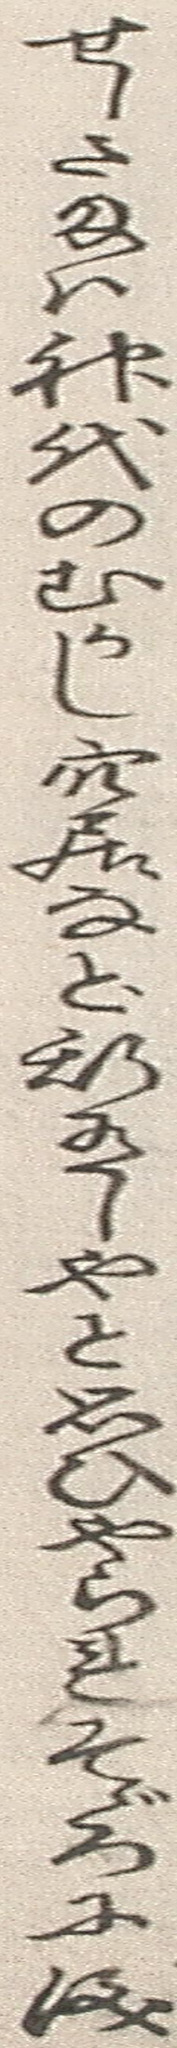せしさまハ神代のむかし穴居など斯有しやと思ひやられそゞろに涙
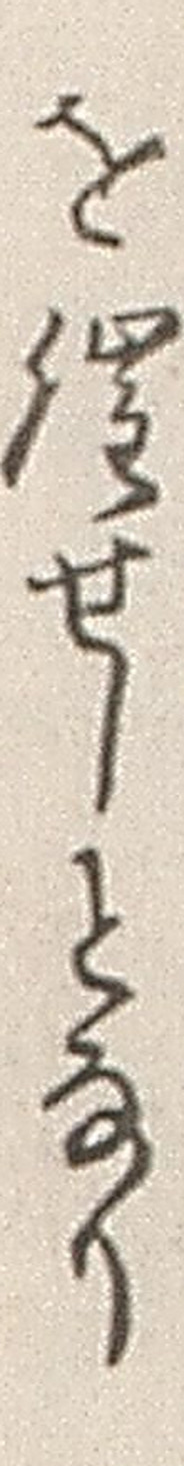を催せしとなり
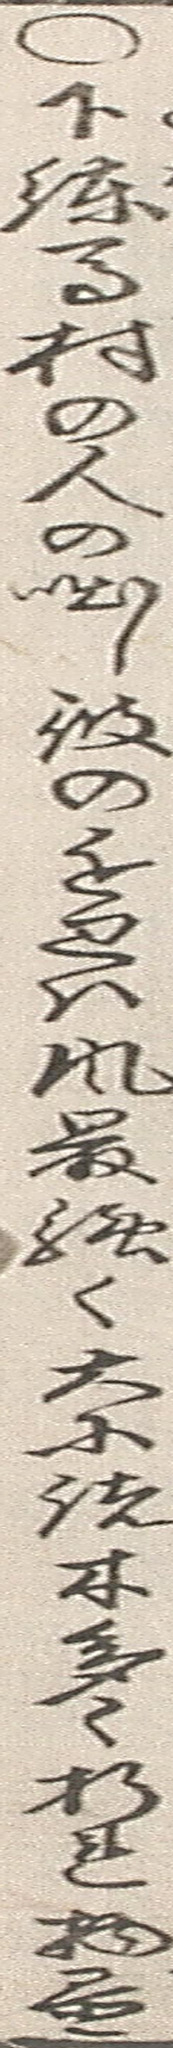◯下練馬村の人の咄し彼の近辺ハ風最強く大小諸木多く折れ物置
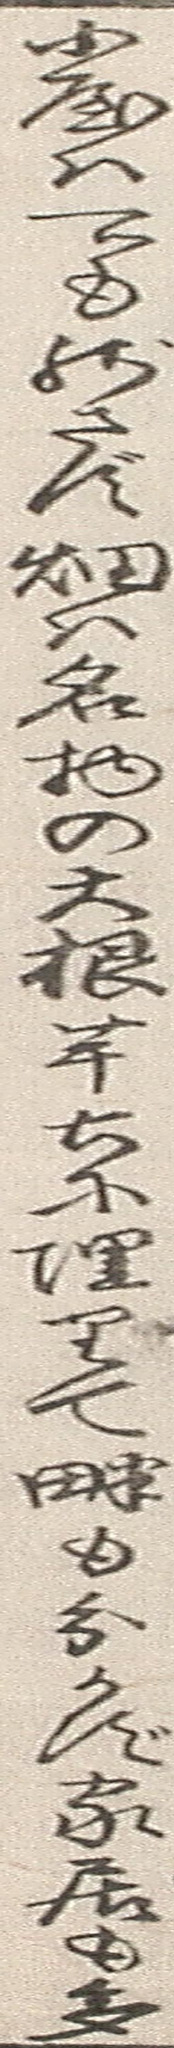小屋ハ一ッも残さず畑ハ名物の大根芋土に埋りて畔も分かず家居も多
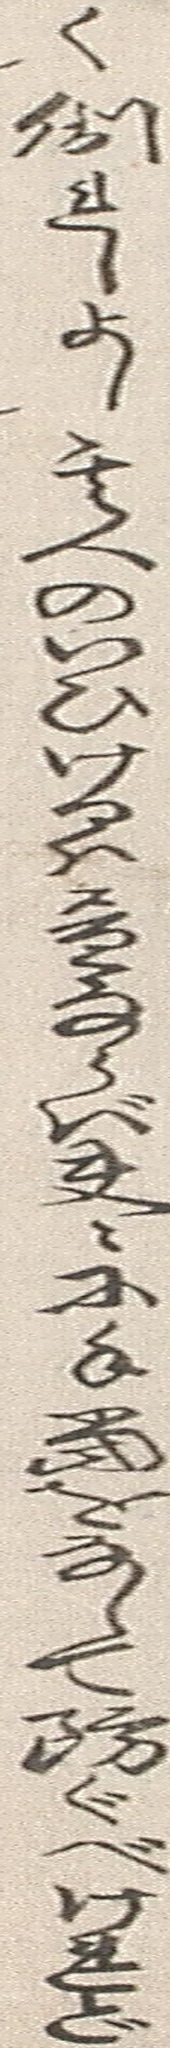く倒れしよし其の人のいひけるハ昼ならバ夫々に手当をなして防ぐべけれど
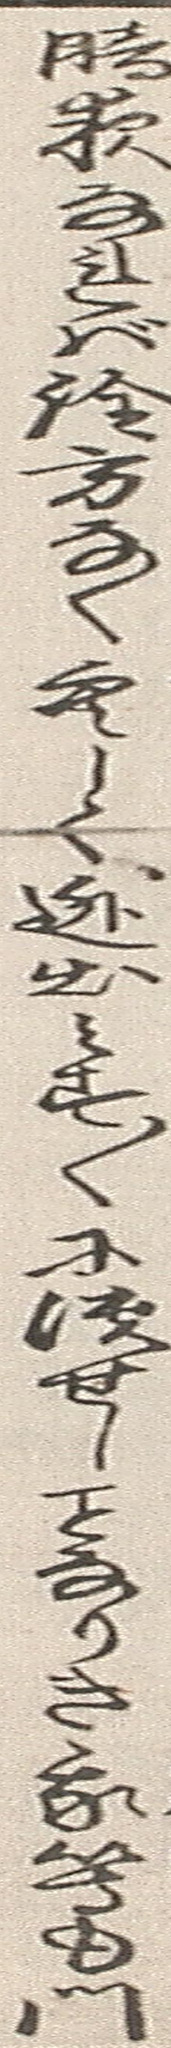暗夜なれバ詮方なく空しく逃出ミす〳〵に潰せしことなりき我等も門
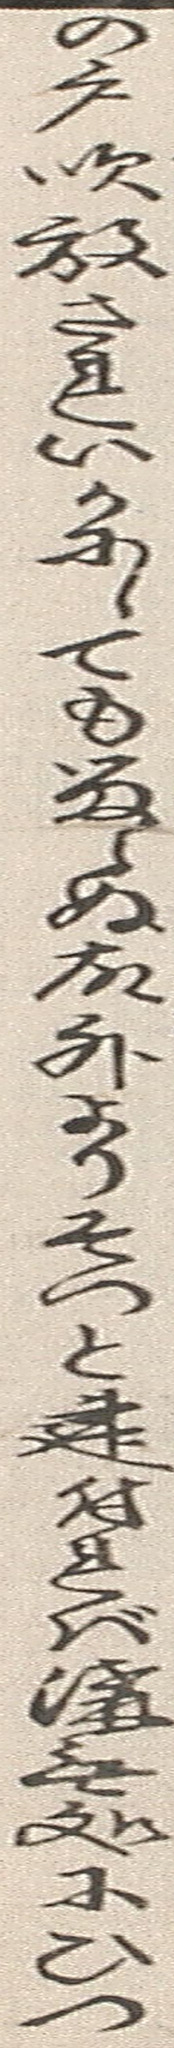の戸吹放されいかにしても留らぬ故外よりそつと建付れバ溝無処にひつ
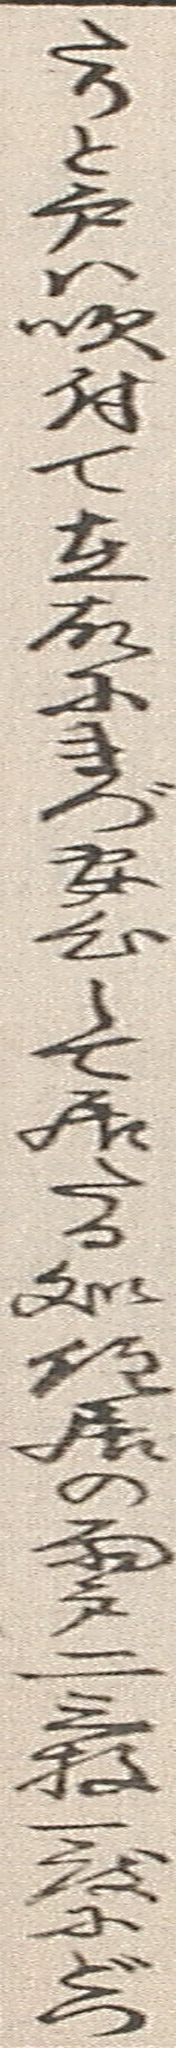たりと戸ハ吹付て在故にまづ安心して居たる処住居の雨戸二三枚一度にどつ
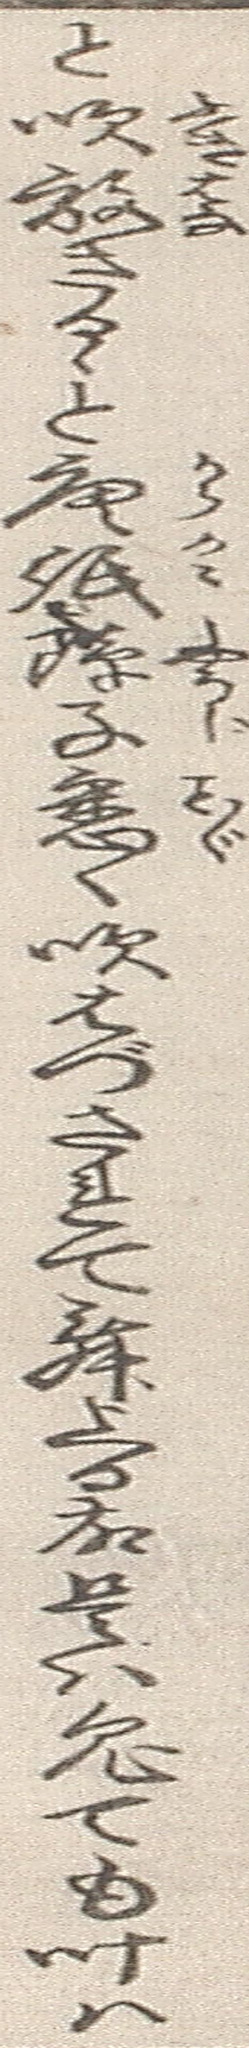と吹放さるゝと唐紙障子悉く吹はづされて舞上る故是ハとても叶ハ
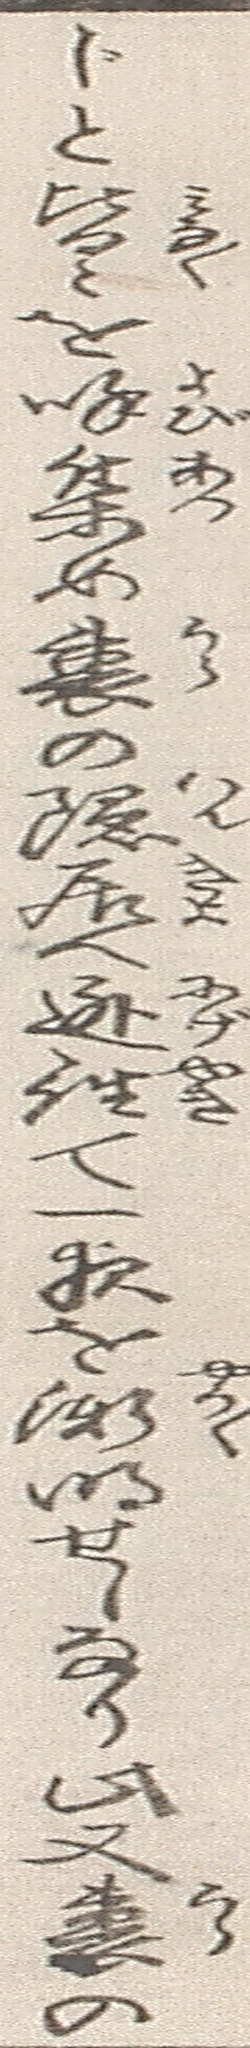じと皆々を呼集め裏の隠居へ逃往て一夜を漸明せしなり此又裏の
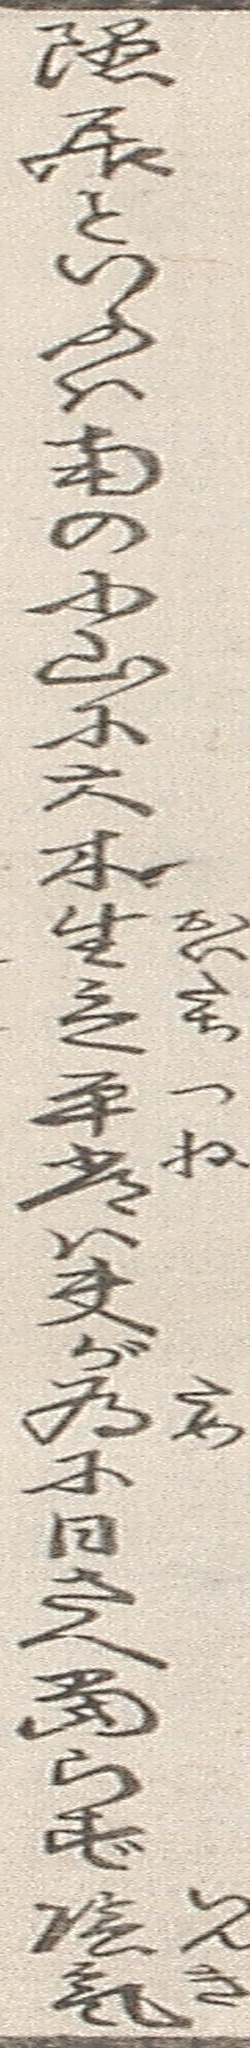隠居といふハ南の小山に大木生立平常ハ夫が為に日さへ当らず陰気
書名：安政風聞集　上中下　全
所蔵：東京大学地震研究所図書室 Earthquake Research Institute Library, The University of Tokyo, JAPAN
